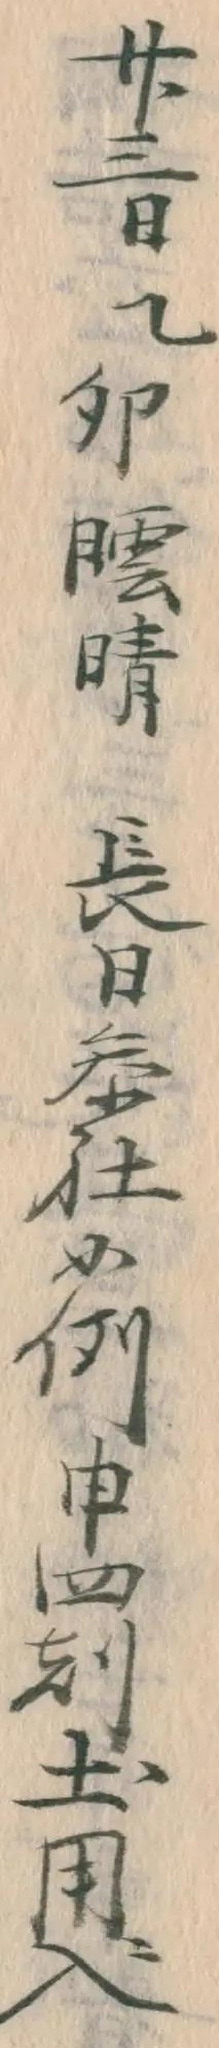廿三日乙卯曇晴長日参社如例申四刻土用ニ入
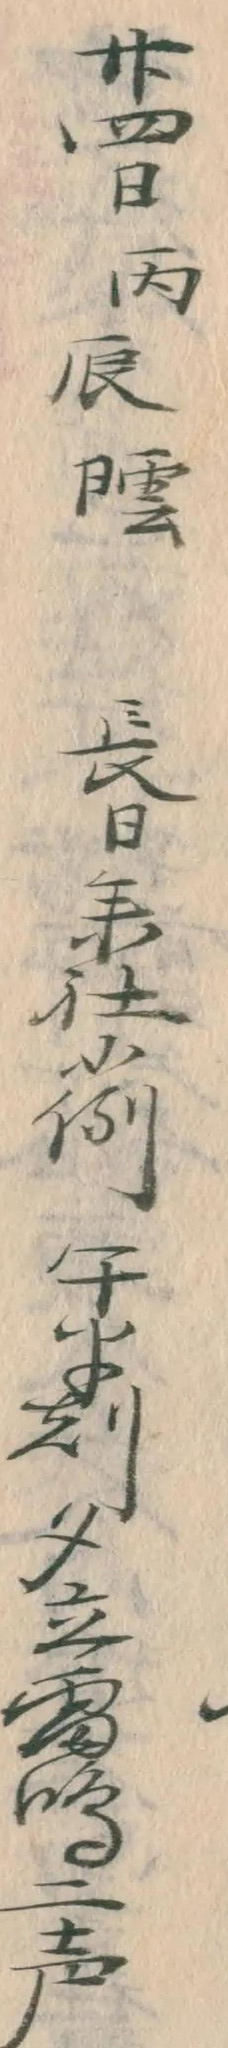廿四日丙良曇長日参社如例午半刻夕立雷鳴二声
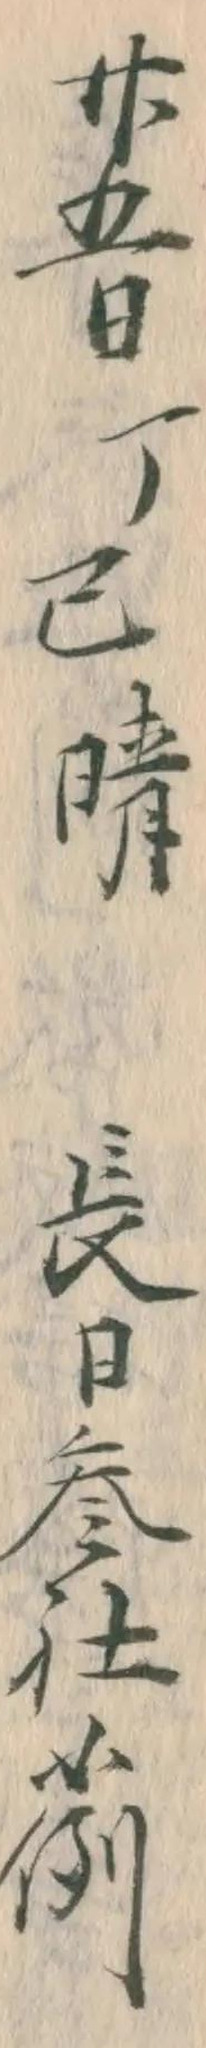廿五日丁巳晴長日参社如例
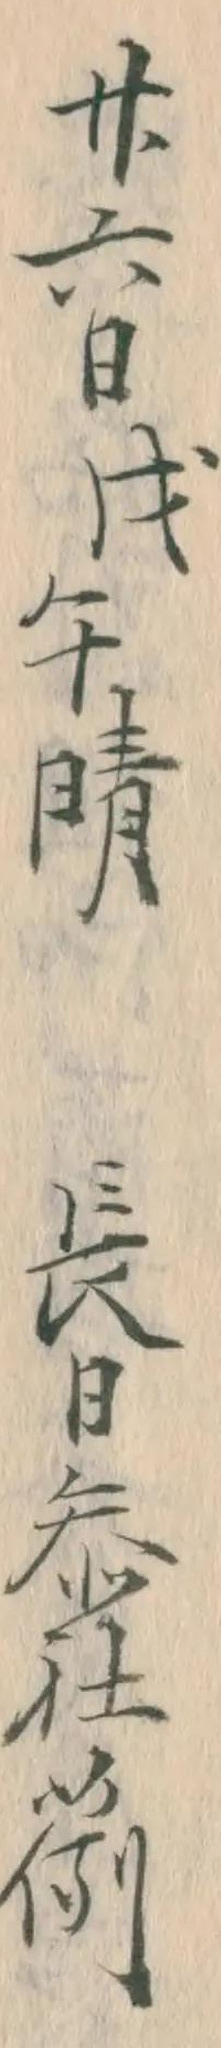廿六日戊午晴長日参社如例
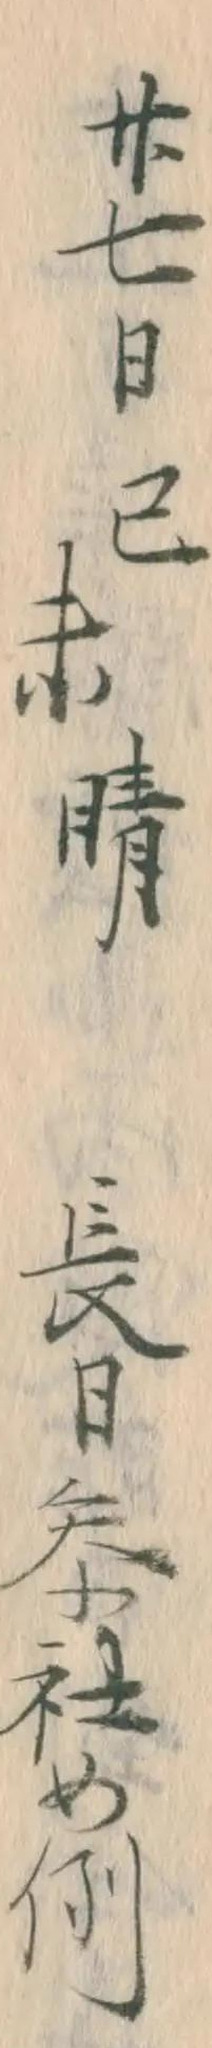廿七日己未晴長日参社如例
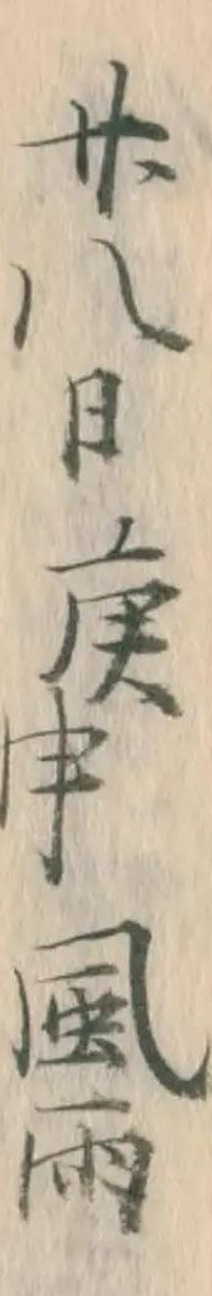廿八日庚申風雨

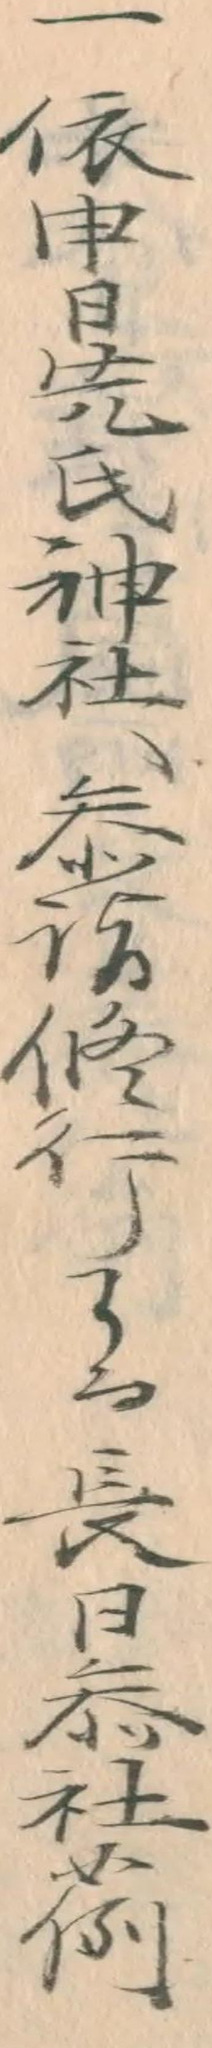一依申日先氏神社へ参詣修行了而長日参社如例
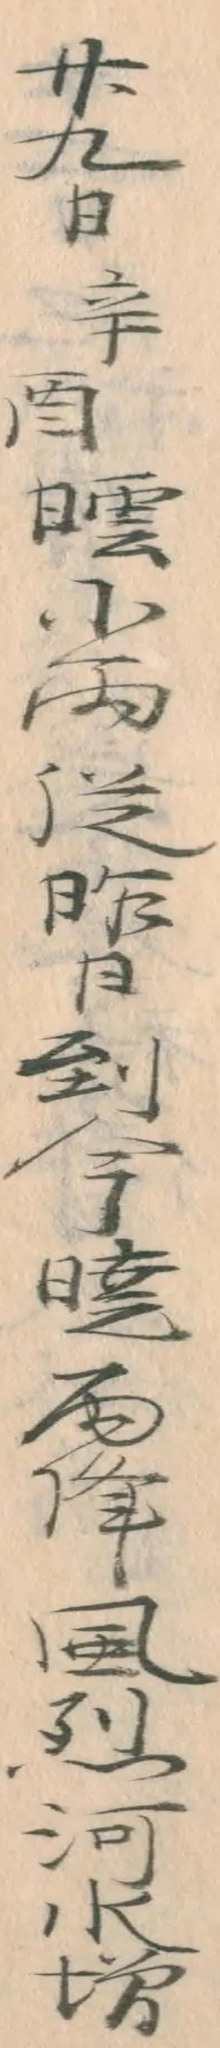廿九日辛酉曇小雨従昨日到今暁雨降風烈河水増
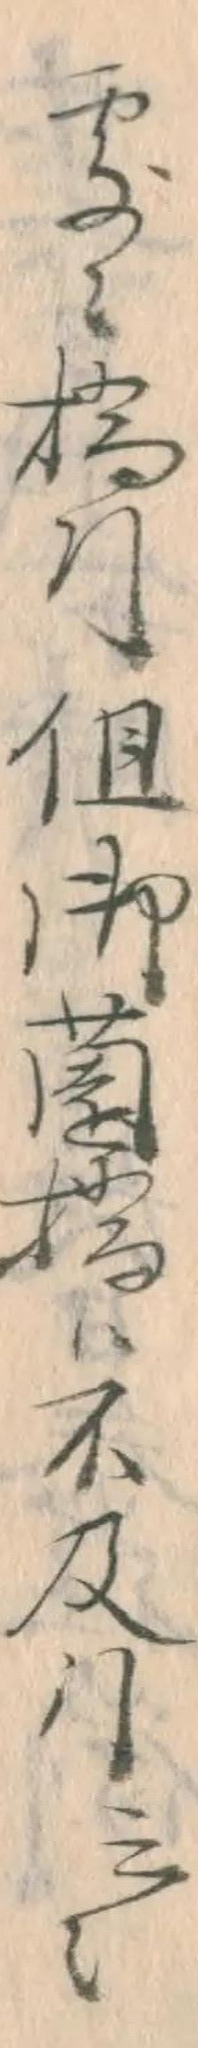處之橋引但御薗橋ハ不及引云〻
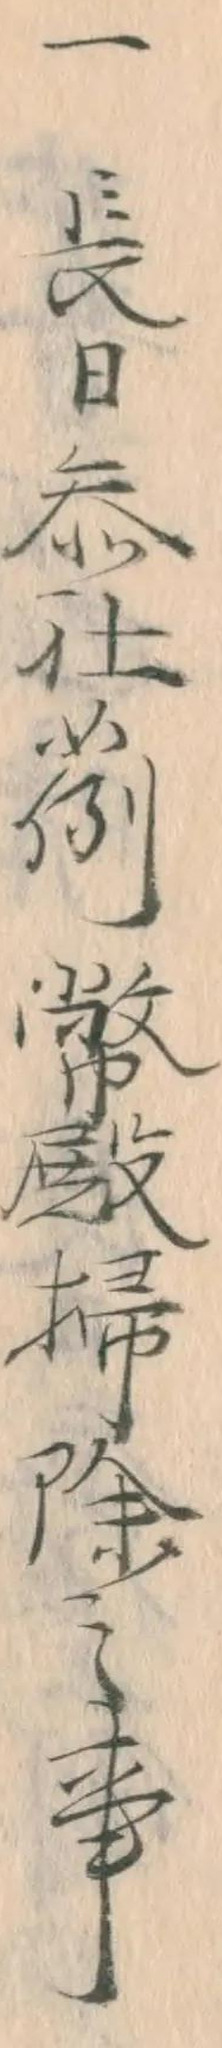一長日参社如例幣殿掃除之事
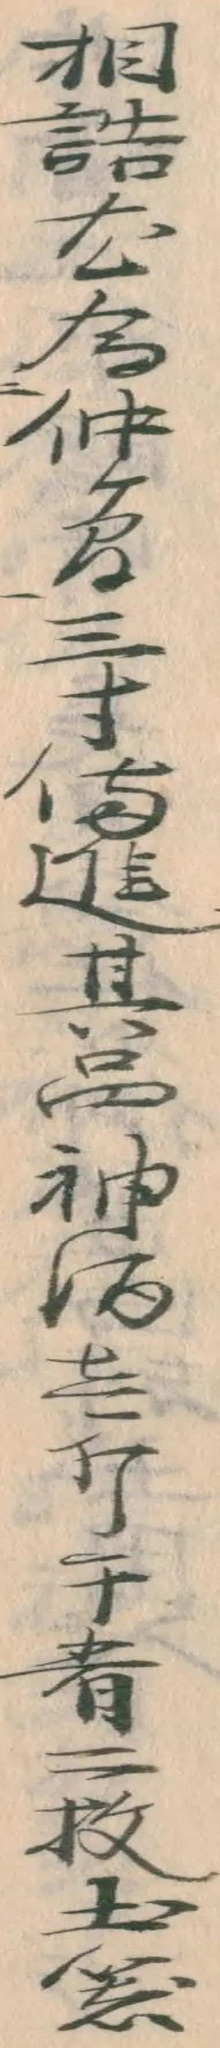相詰尤為仲ヶ間三寸備進其品神酒壱斤干肴二枚土器
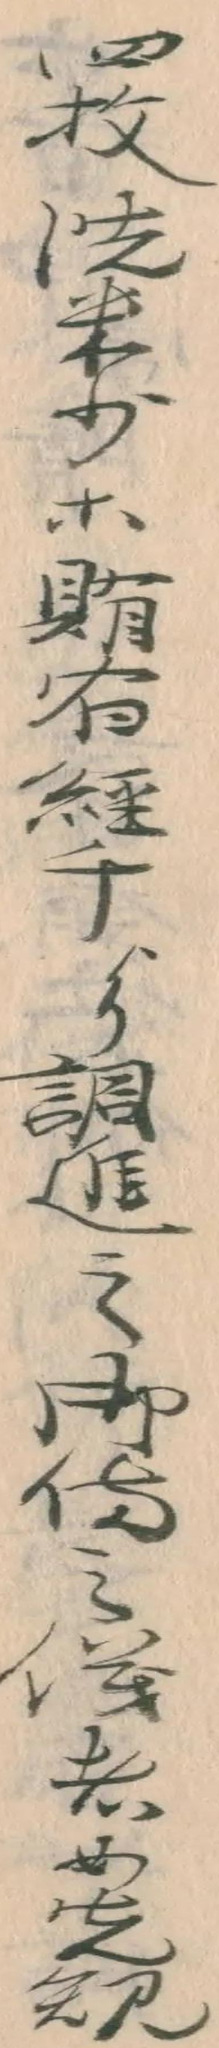四枚洗米少等賄宿経千より調進之御備之儀者先規
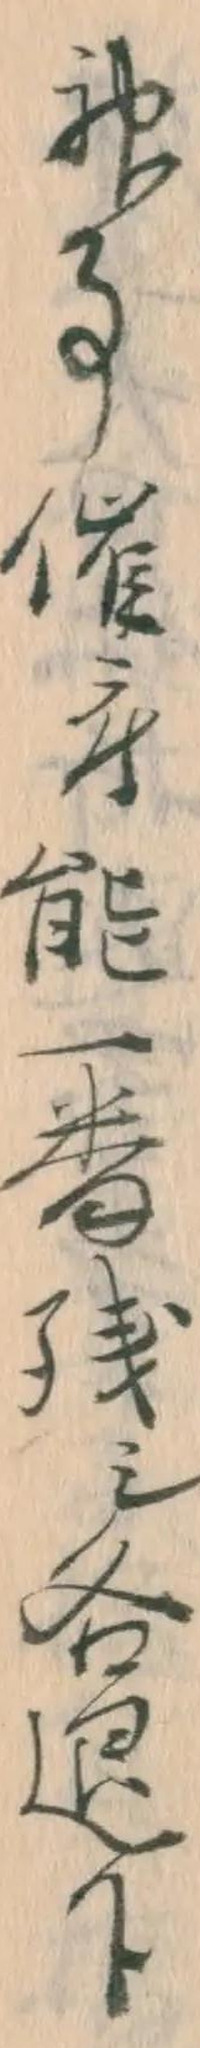神事催ニ付能一番残シ各退下
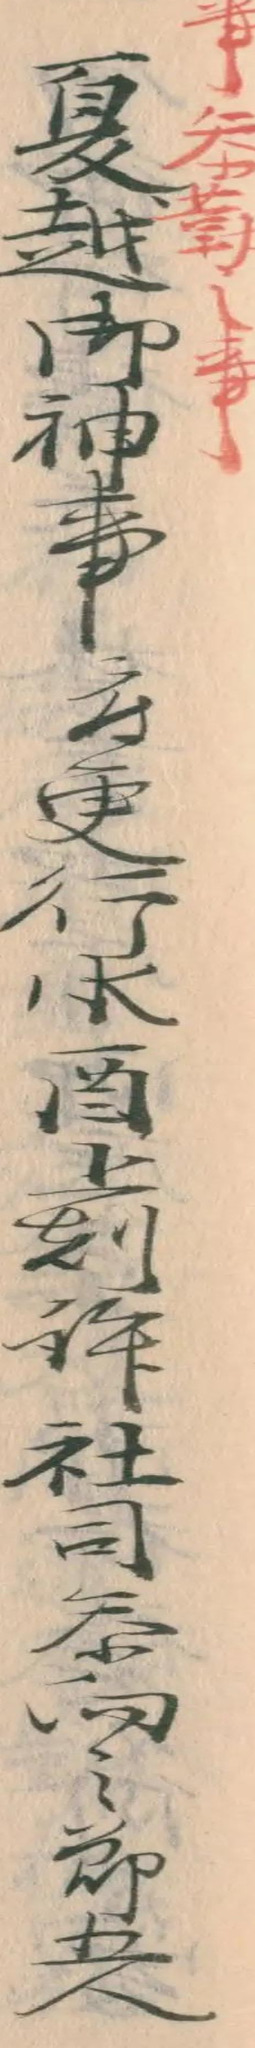一夏越御神事ニ付更行水酉上刻許社司昼向之節五人
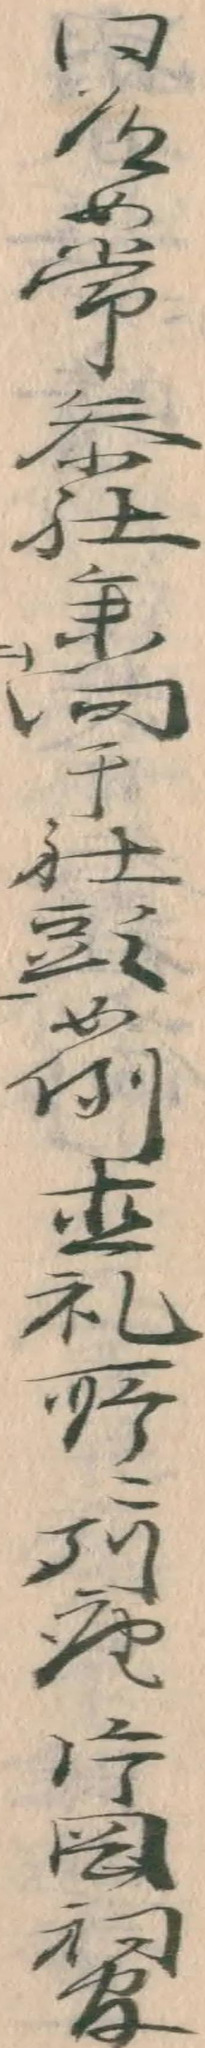同道如常参社参向于社頭如例直礼所ニ列座片岡祠官
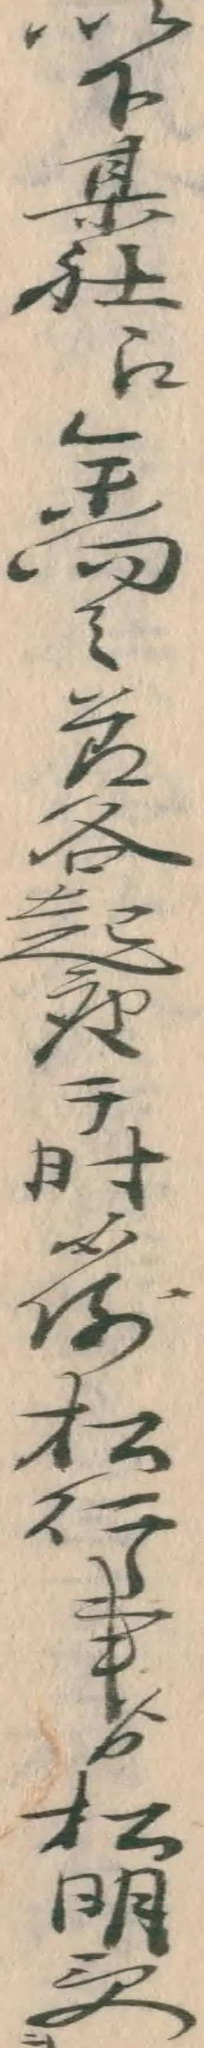以下某社え参向之節各起座于時如例松行事ゟ松明受
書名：賀茂社記録. 第73冊
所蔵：国立国会図書館 National Diet Library, JAPAN
